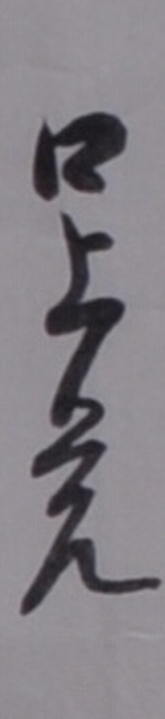口上覚
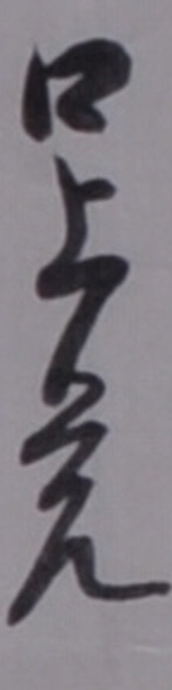口上覚
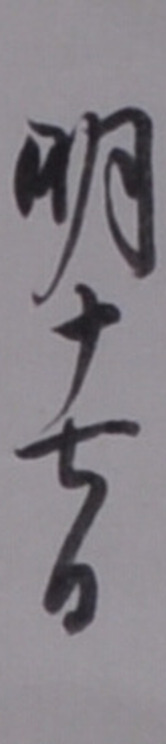明十七日
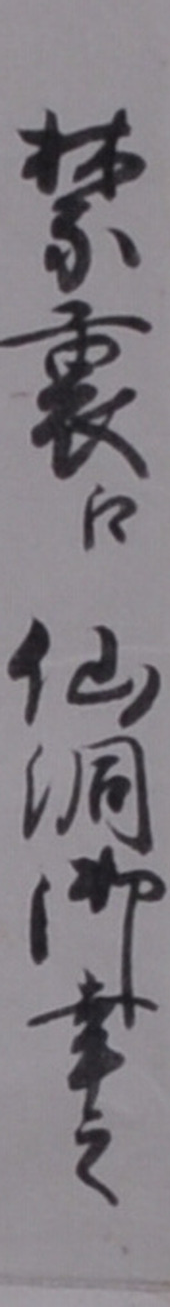禁裏え仙洞御幸之
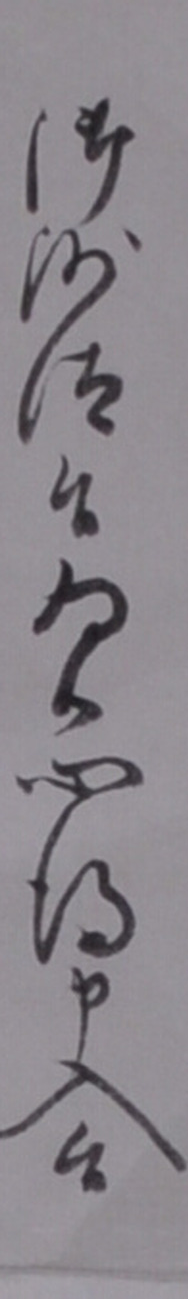御沙汰候為御心得申入候
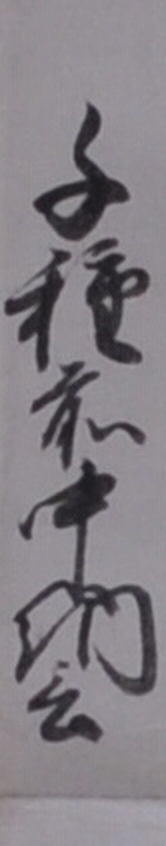千種前中納言
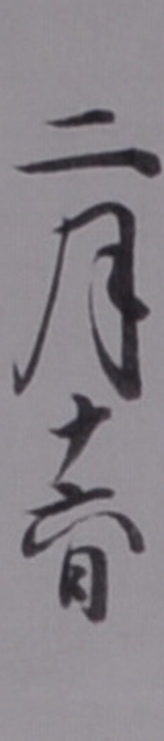二月十六日
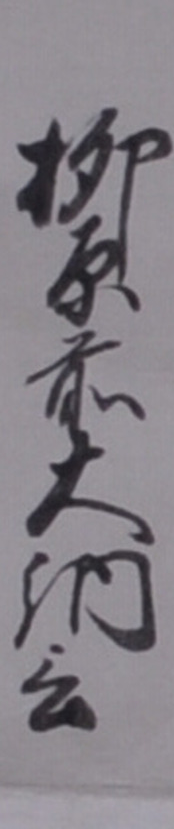柳原前大納言
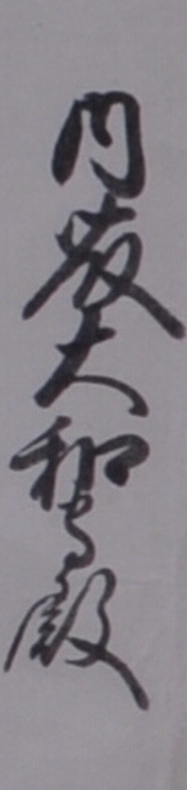内藤大和守殿
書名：口上覚
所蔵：伊那市立高遠町図書館・合同会社AMANE
